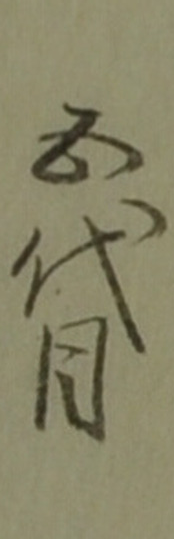五代目
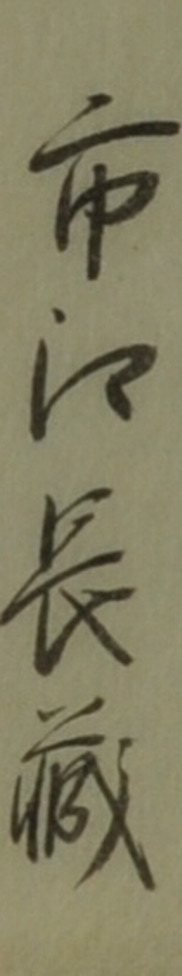市江長蔵
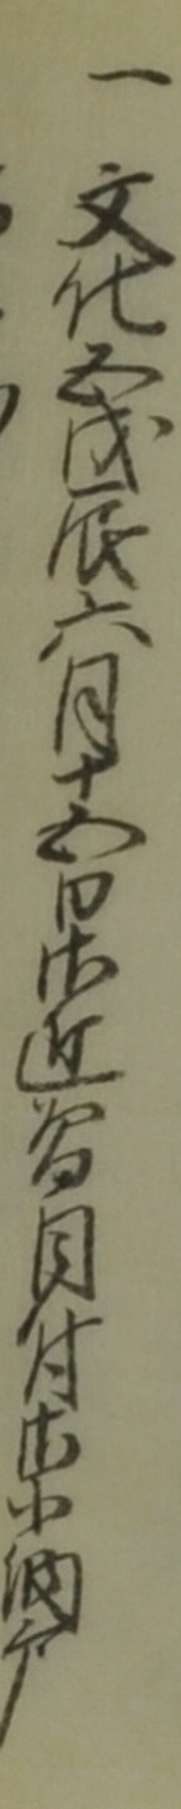一文化五戊辰六月十五日御近習目付御小納戸
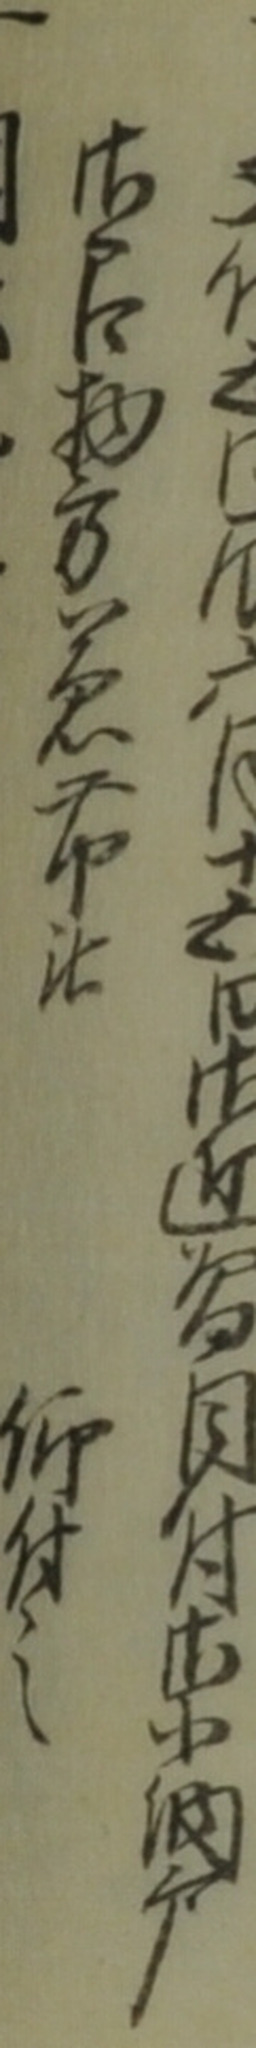御召物方兼帯被仰付之
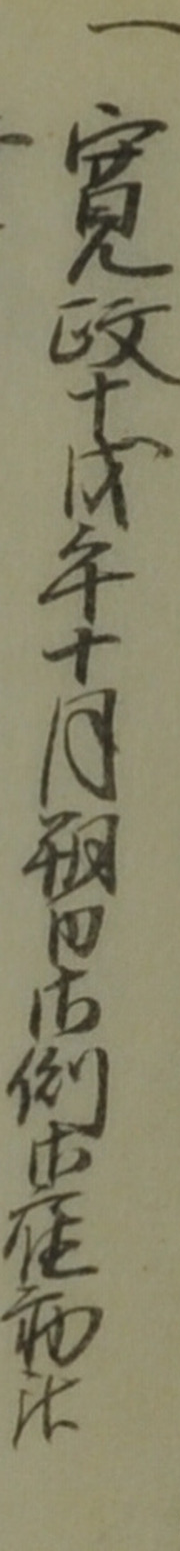一寛政十戊午十月朔日御側御雇勤被
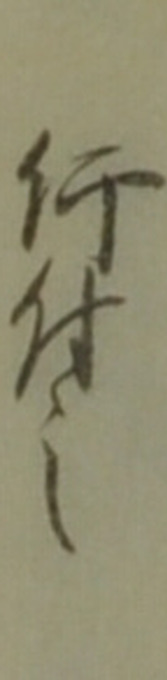仰付之
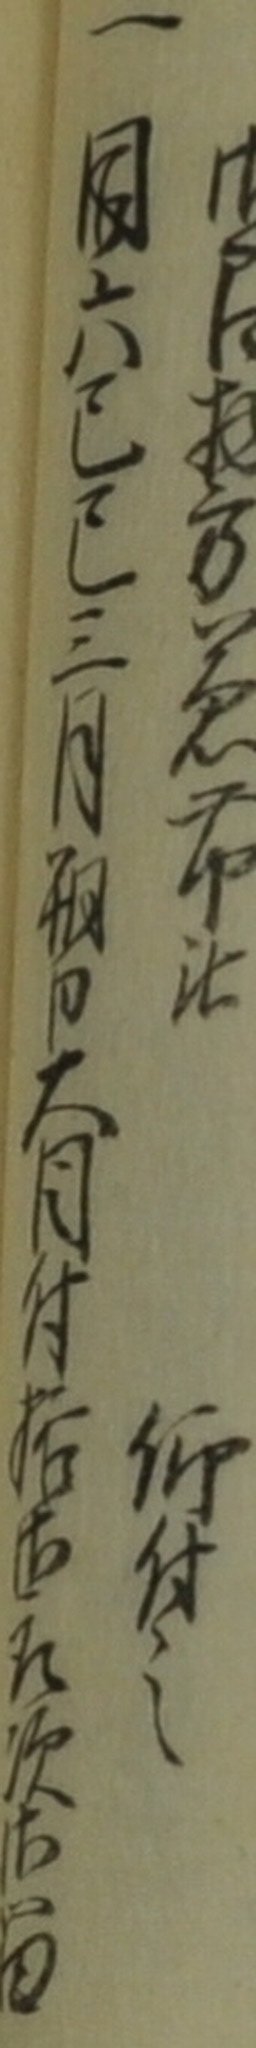一同六己巳三月朔日大目付格御取次御留
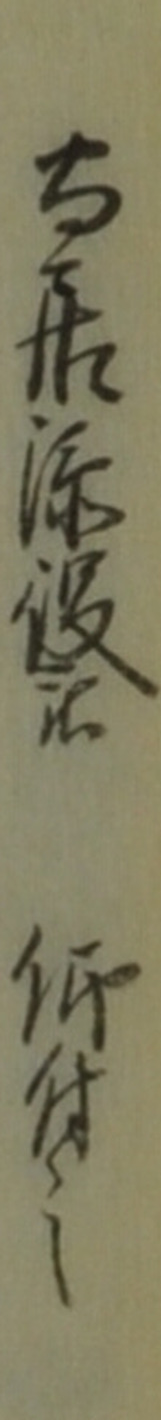守居添役被仰付之
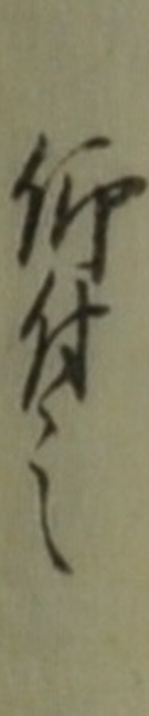仰付之
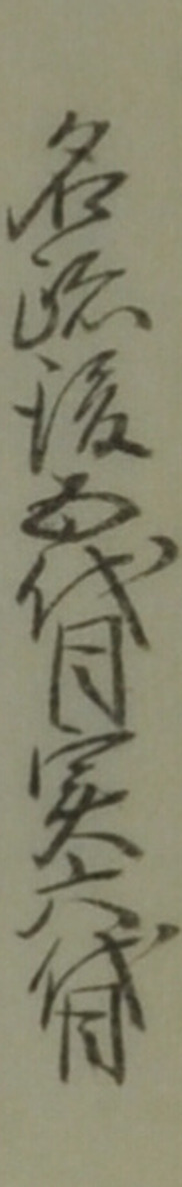名跡後五代目実六代目
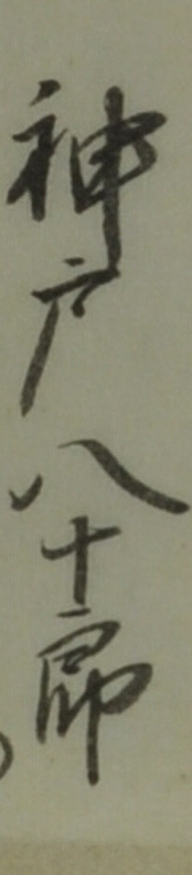神戸八十郎
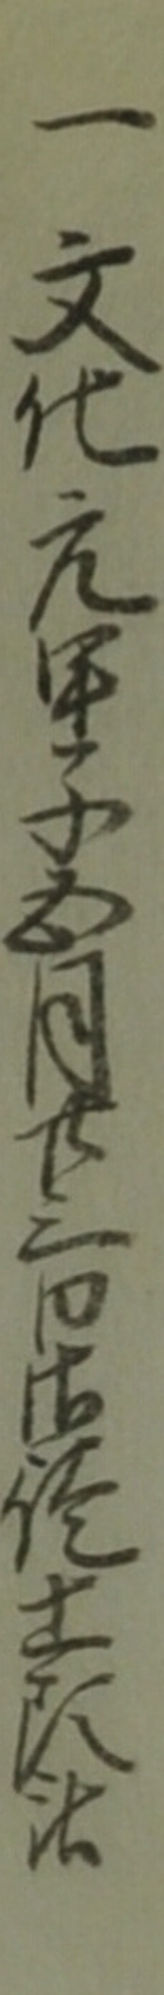一文化元甲子五月廿三日御徒士頭被
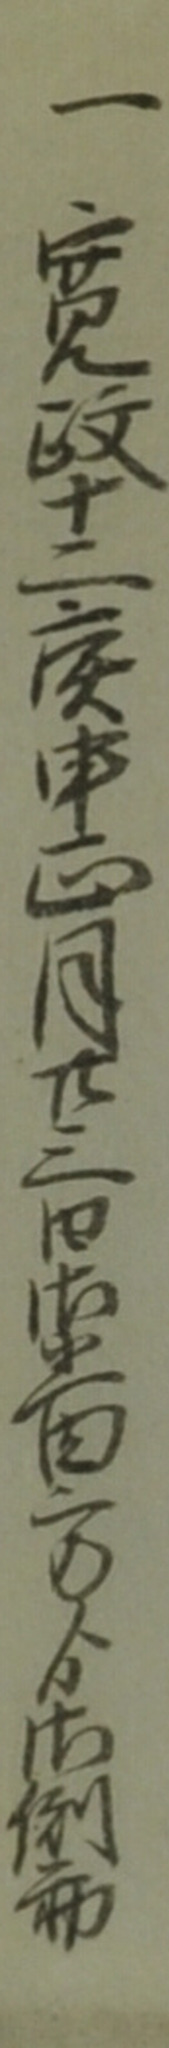一寛政十二庚申正月廿三日御番方ゟ御側勤
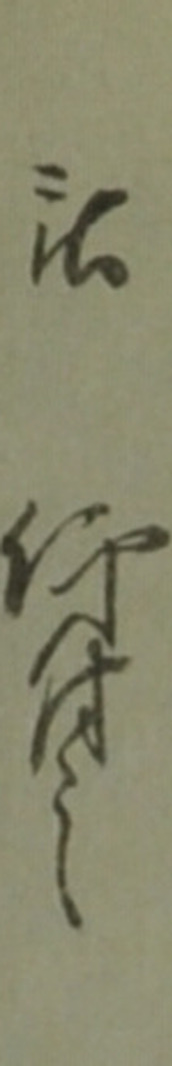被仰付之
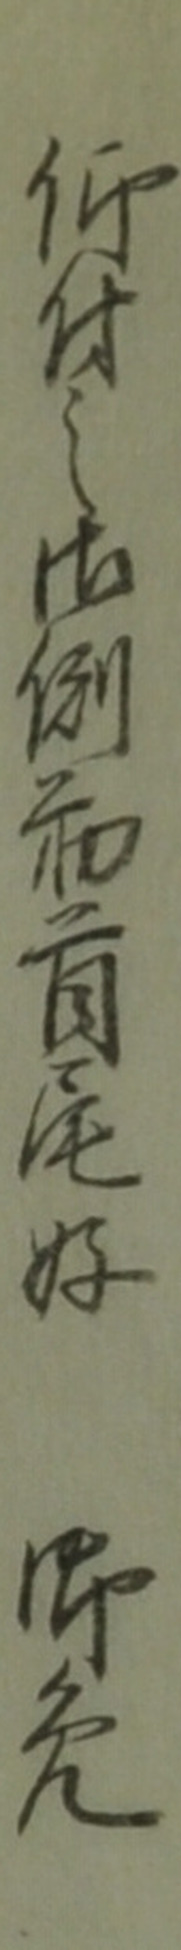仰付之御側勤首尾好御免
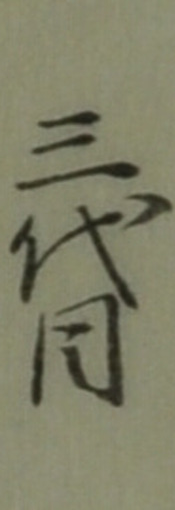三代目
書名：諸御役代々録（五）
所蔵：伊那市立高遠町図書館・合同会社AMANE
